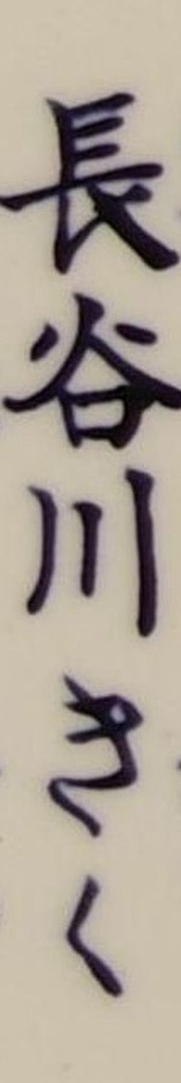長谷川きく
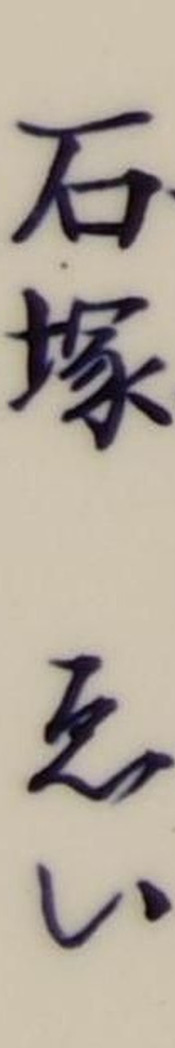石塚ゑい
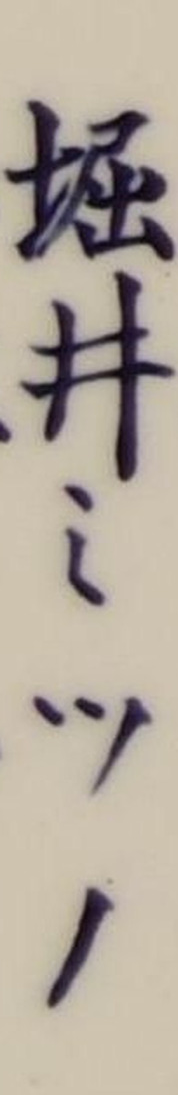堀井ミツノ
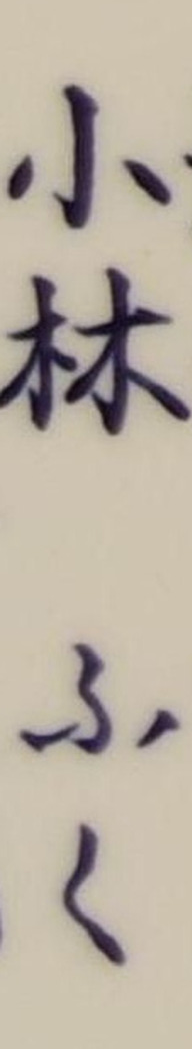小林ふく
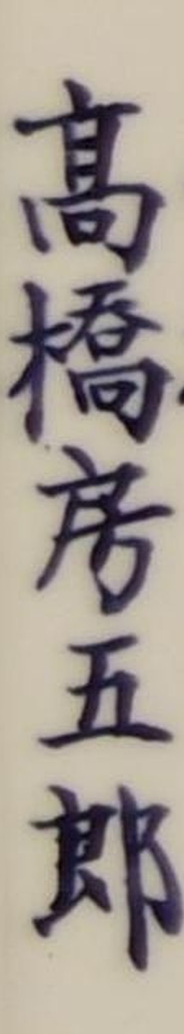高橋房五郎

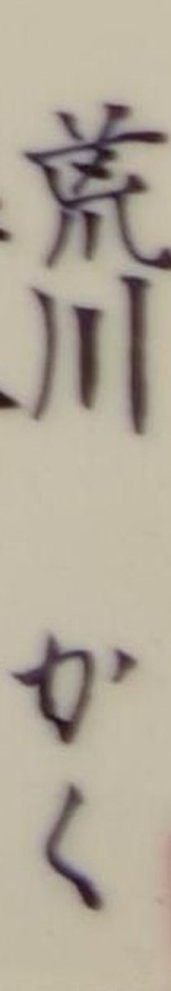荒川かく
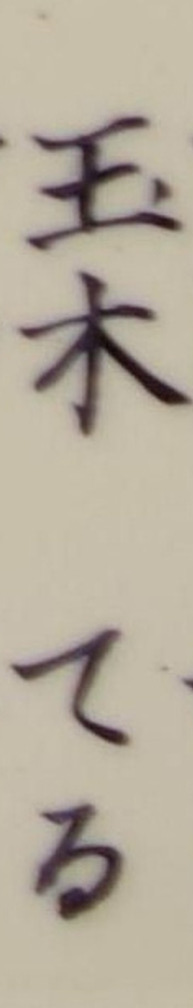玉木てる
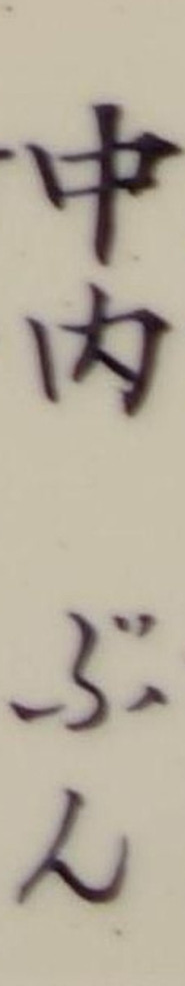中内ぶん
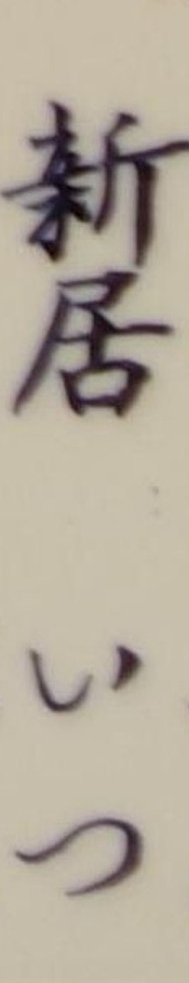新居いつ
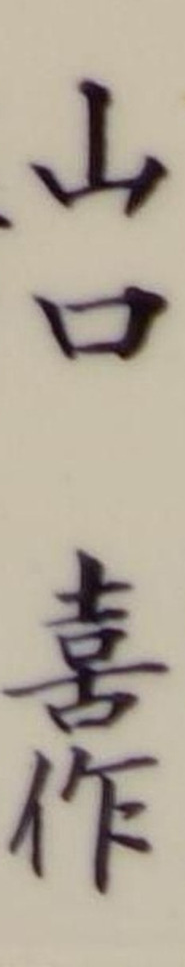山口喜作
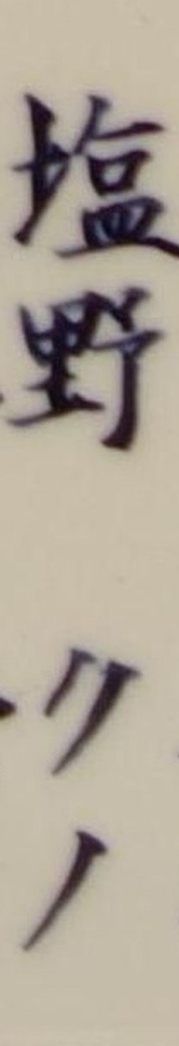塩野クノ
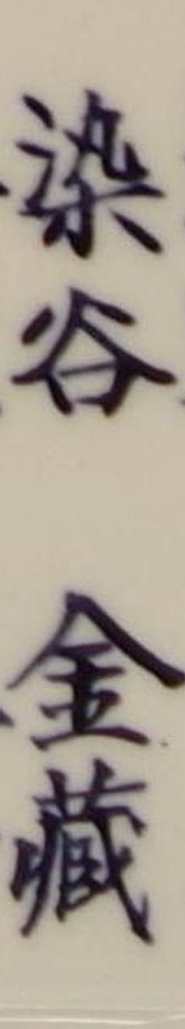染谷金蔵
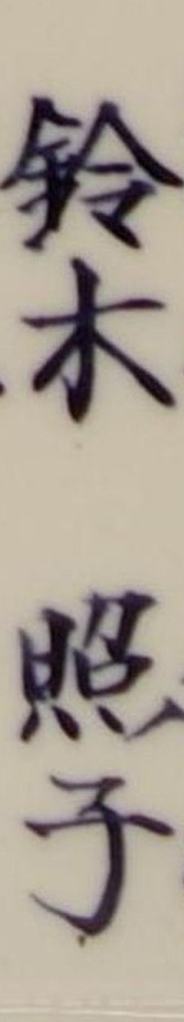鈴木照子
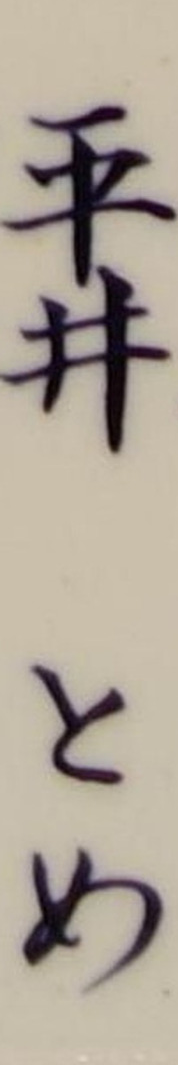平井とめ
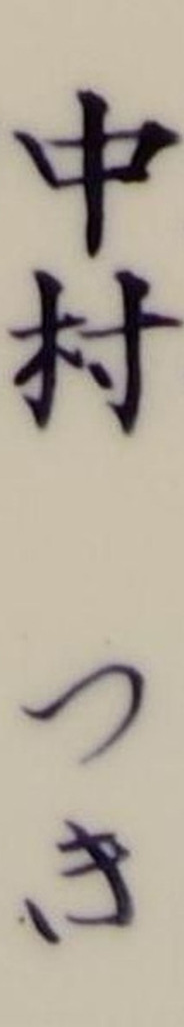中村つき
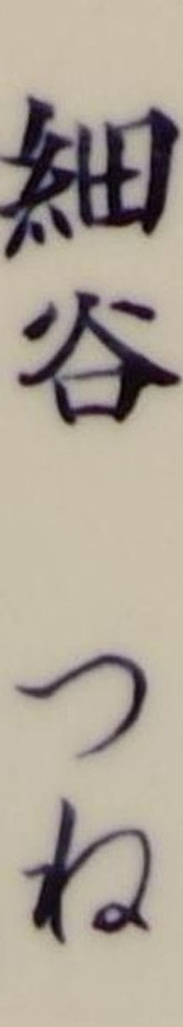細谷つね
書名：M~S
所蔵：高野山金剛峯寺
